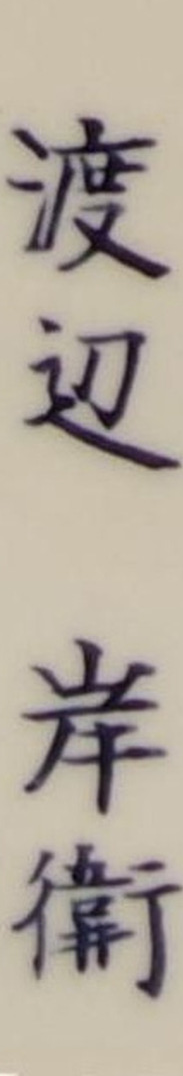渡辺岸衛
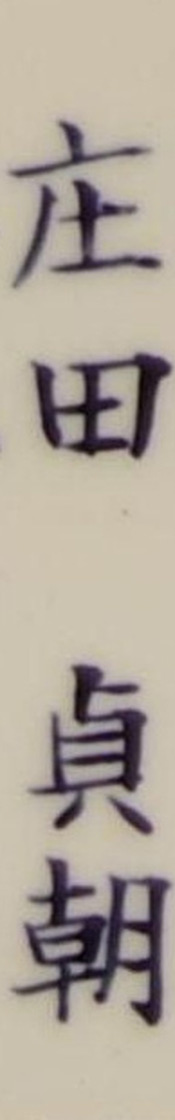庄田貞朝
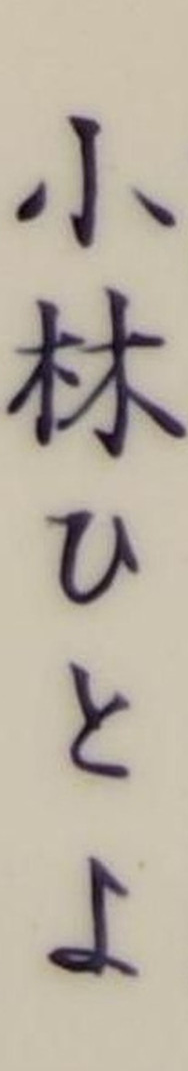小林ひとよ

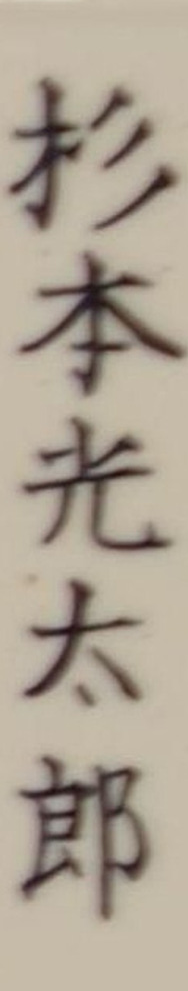杉本光太郎
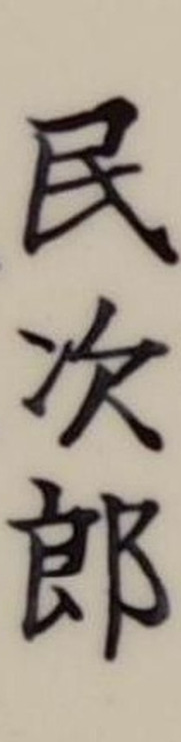民次郎
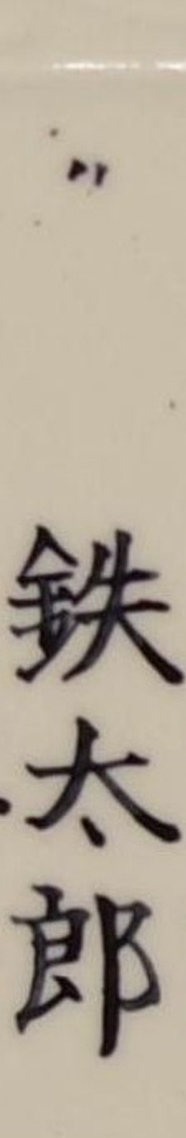鉄太郎
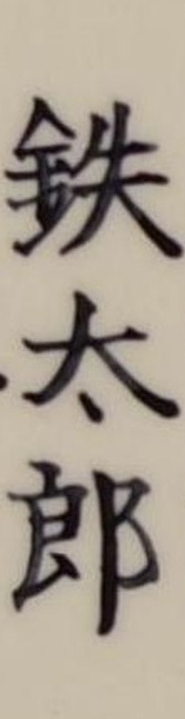鉄太郎
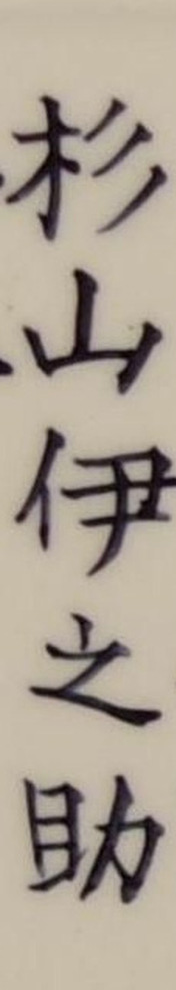杉山伊之助
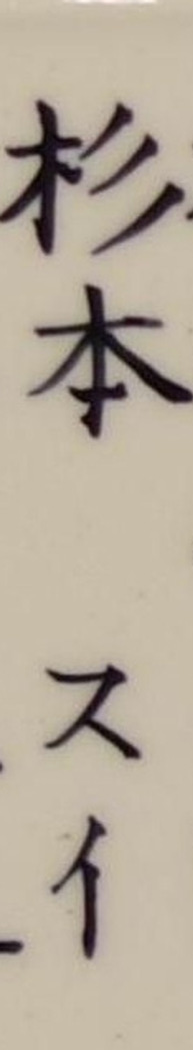杉本スイ
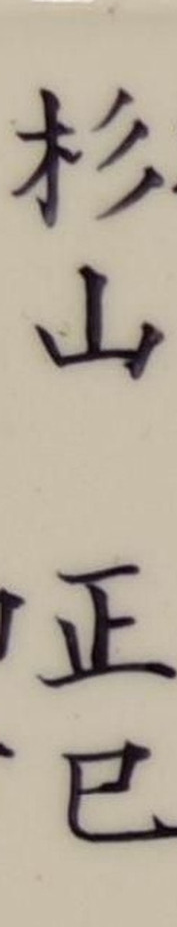杉山正巳

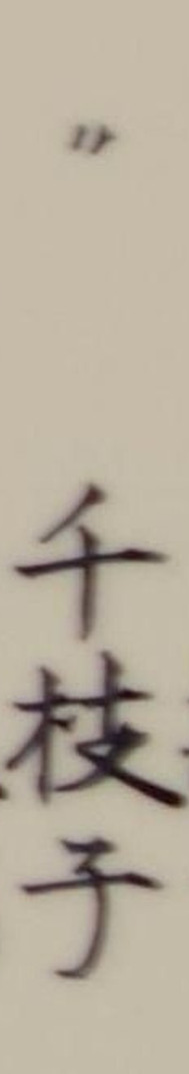千枝子
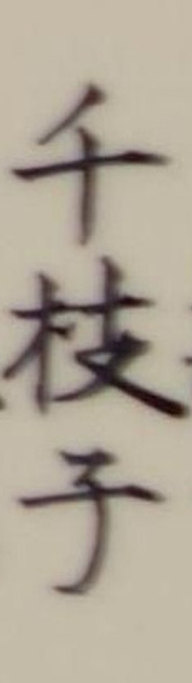千枝子
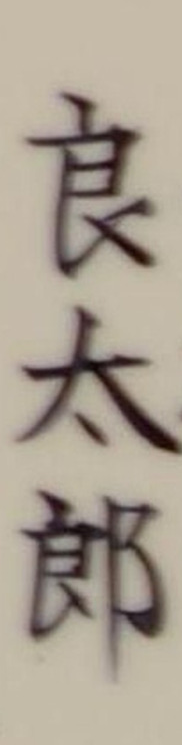良太郎
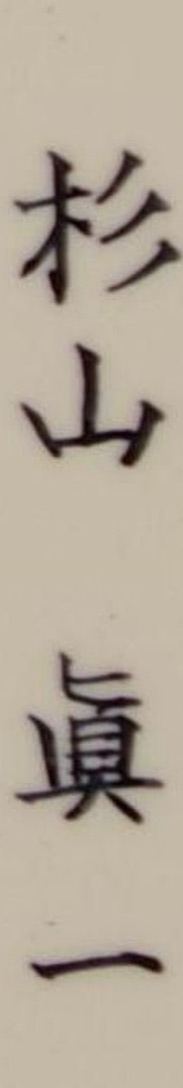杉山真一
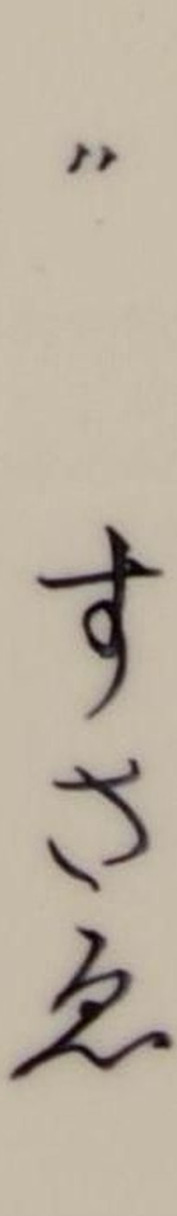すさゑ
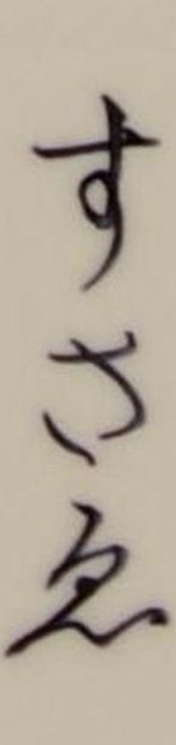すさゑ
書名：M~S
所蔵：高野山金剛峯寺
